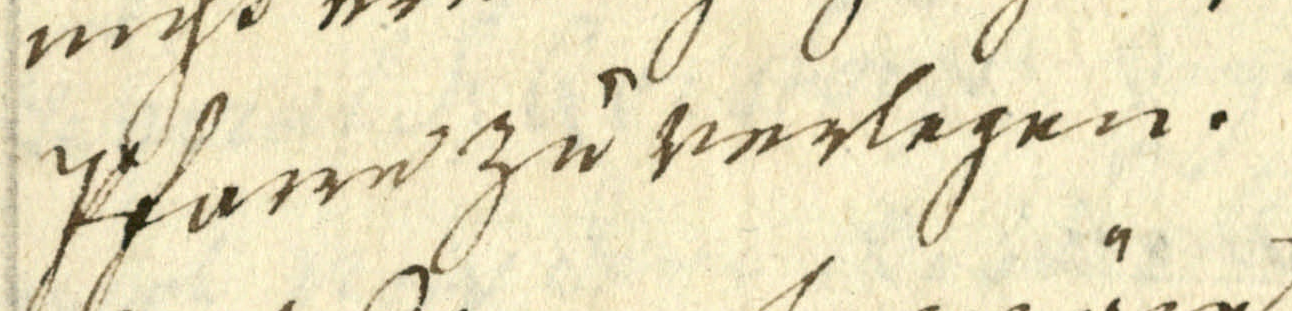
Pfarre zu verlegen.
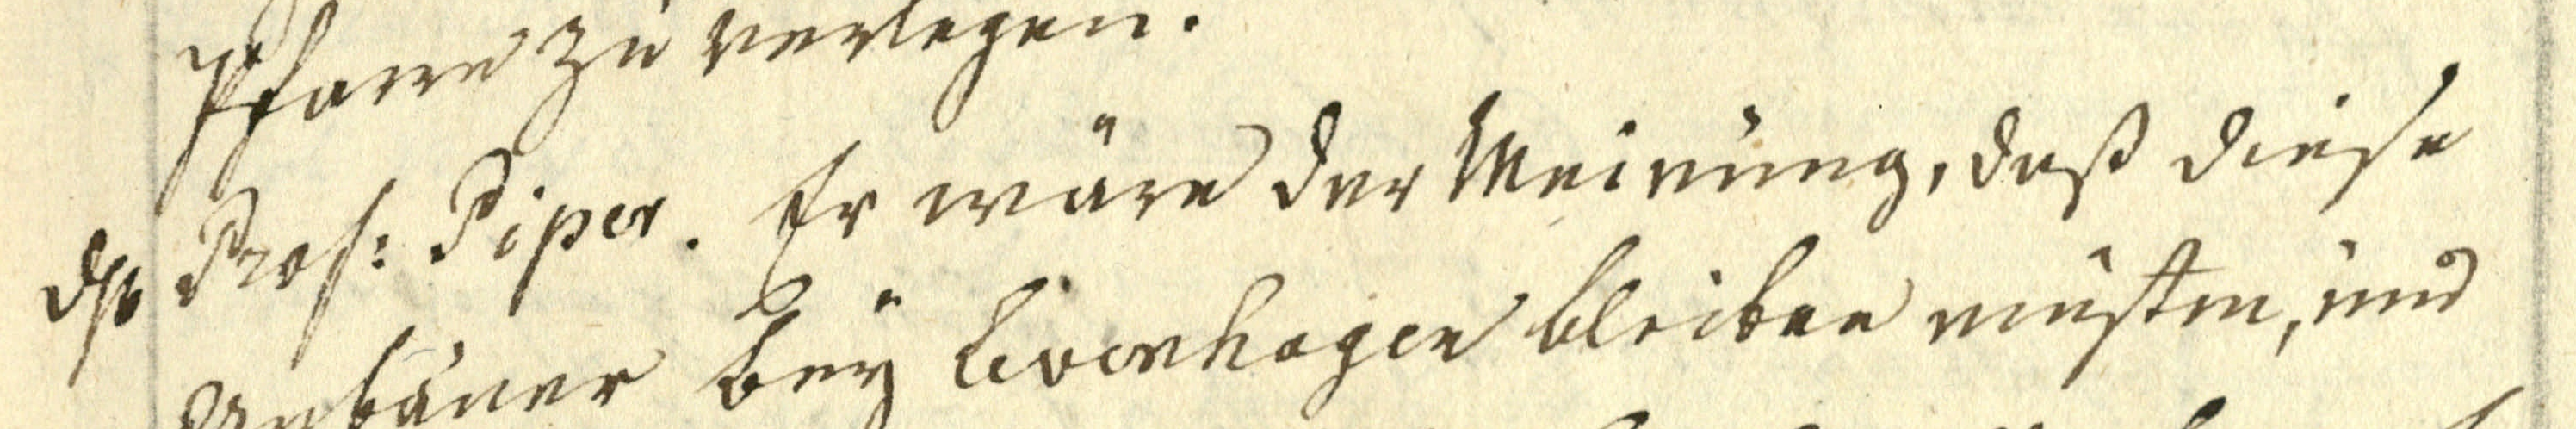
dh Prof. Piper Er wäre der Meinung, daß diese
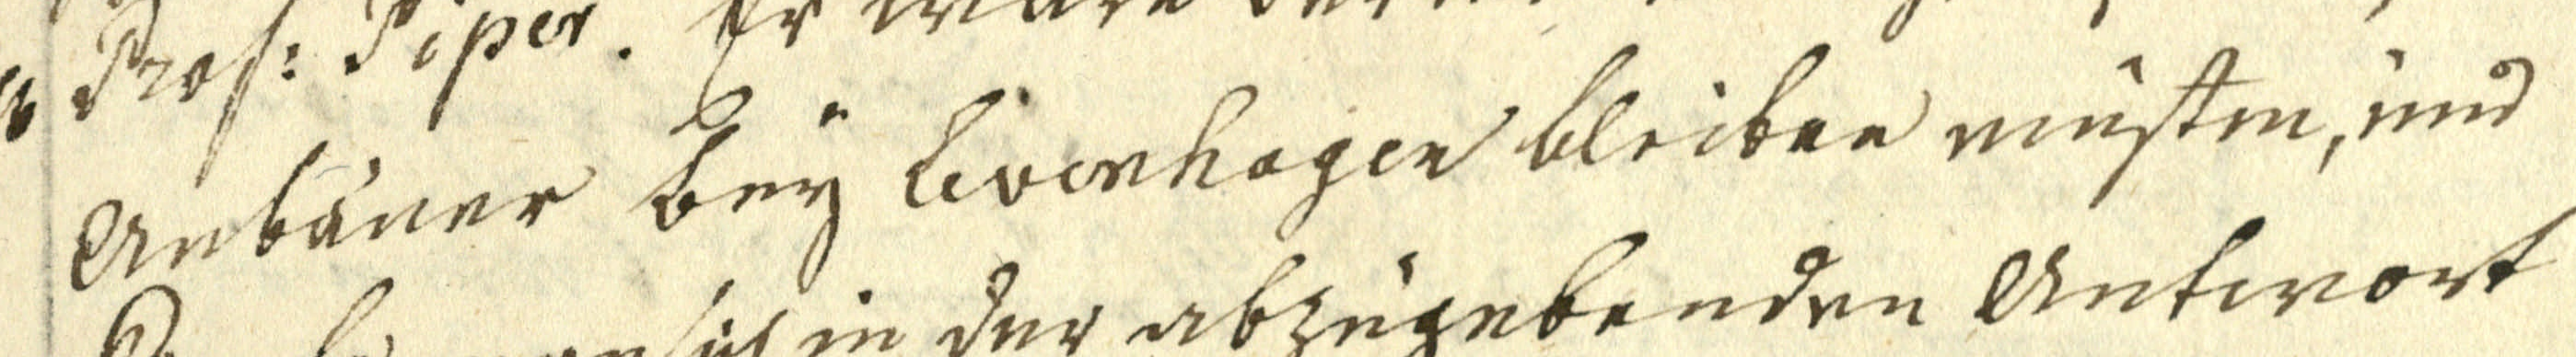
Anbauer beÿ Levenhagen bleiben müsten, und
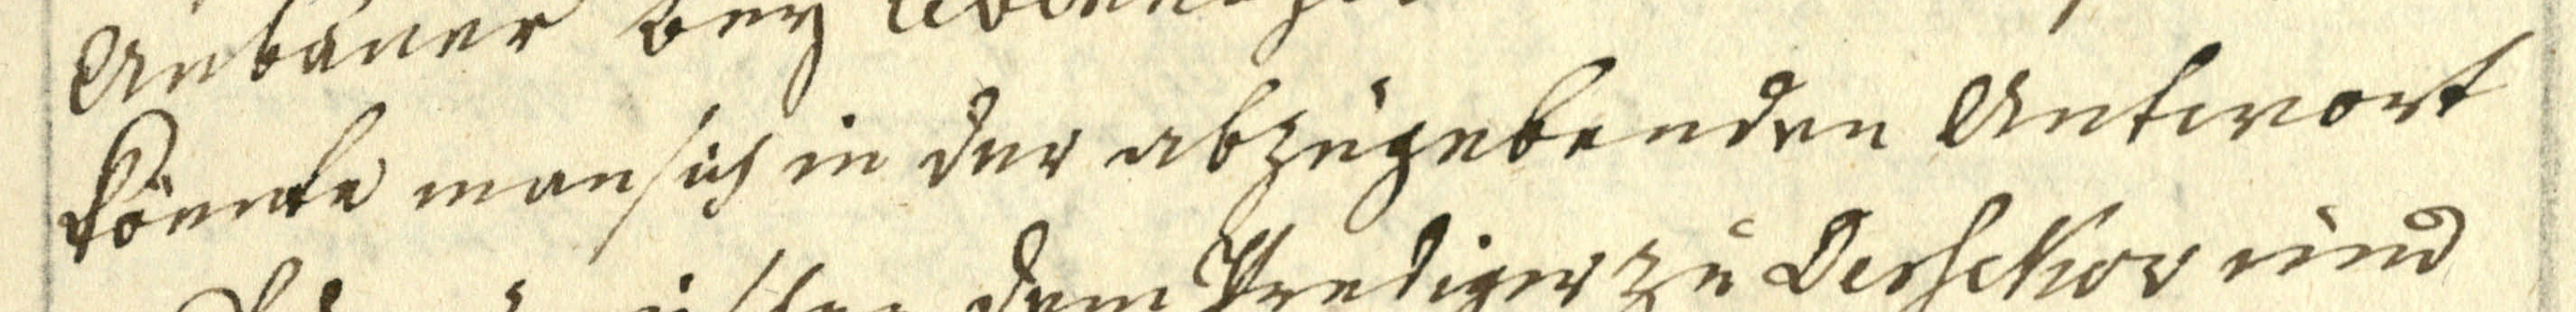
könnte man sich in der abzugebenden Antwort
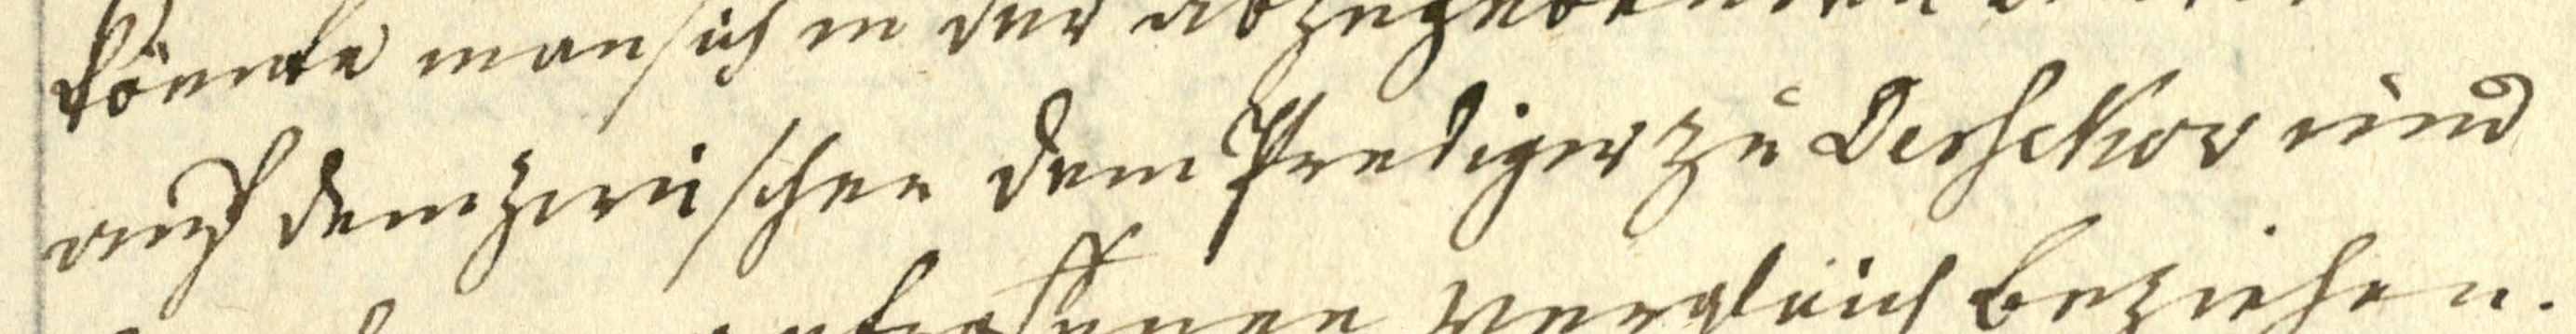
auf dem zwischen dem Prediger zu Dersekow und
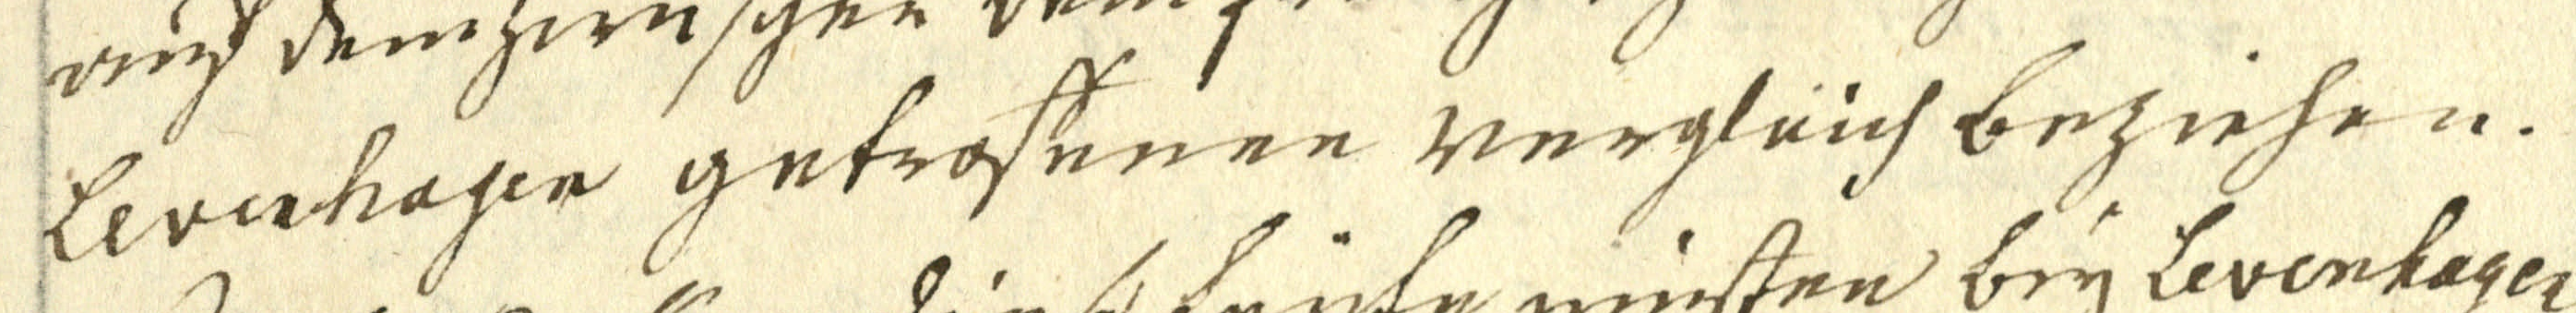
Levenhagen getroffenen Vergleich beziehen.
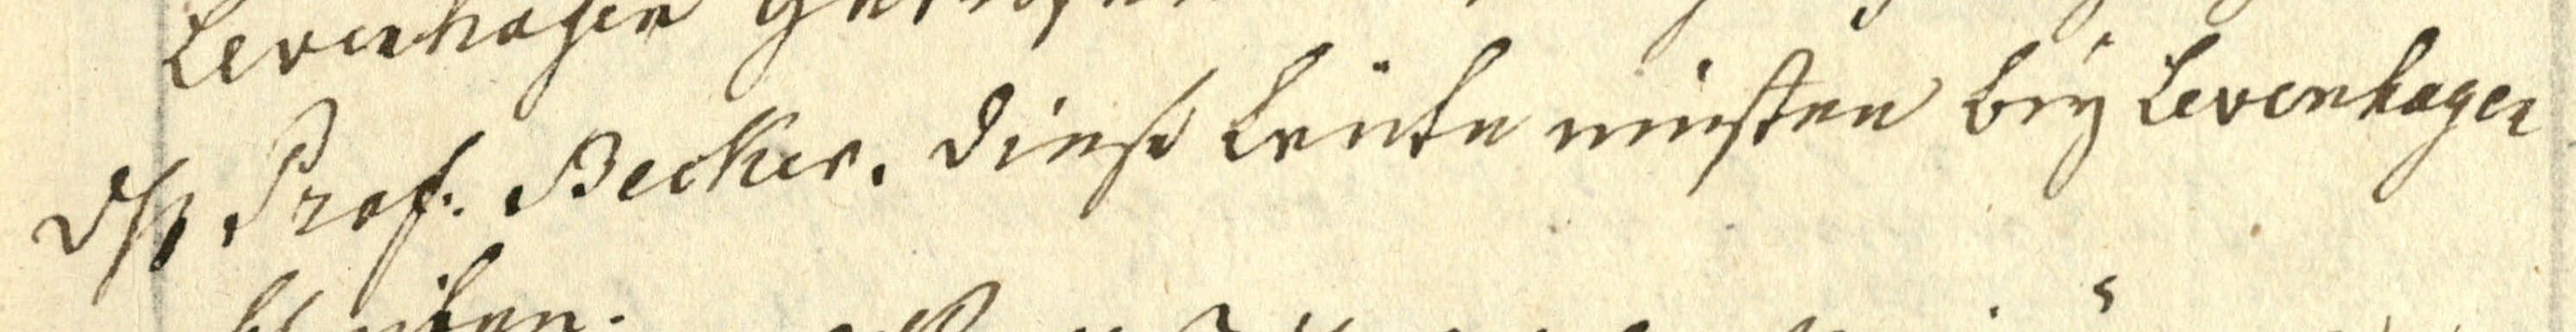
dh Prof. Becker, diese Leute müsten beÿ Levenhagen
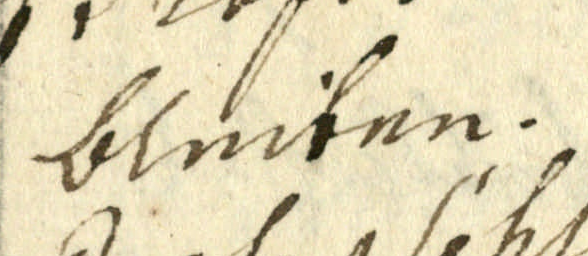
bleiben.
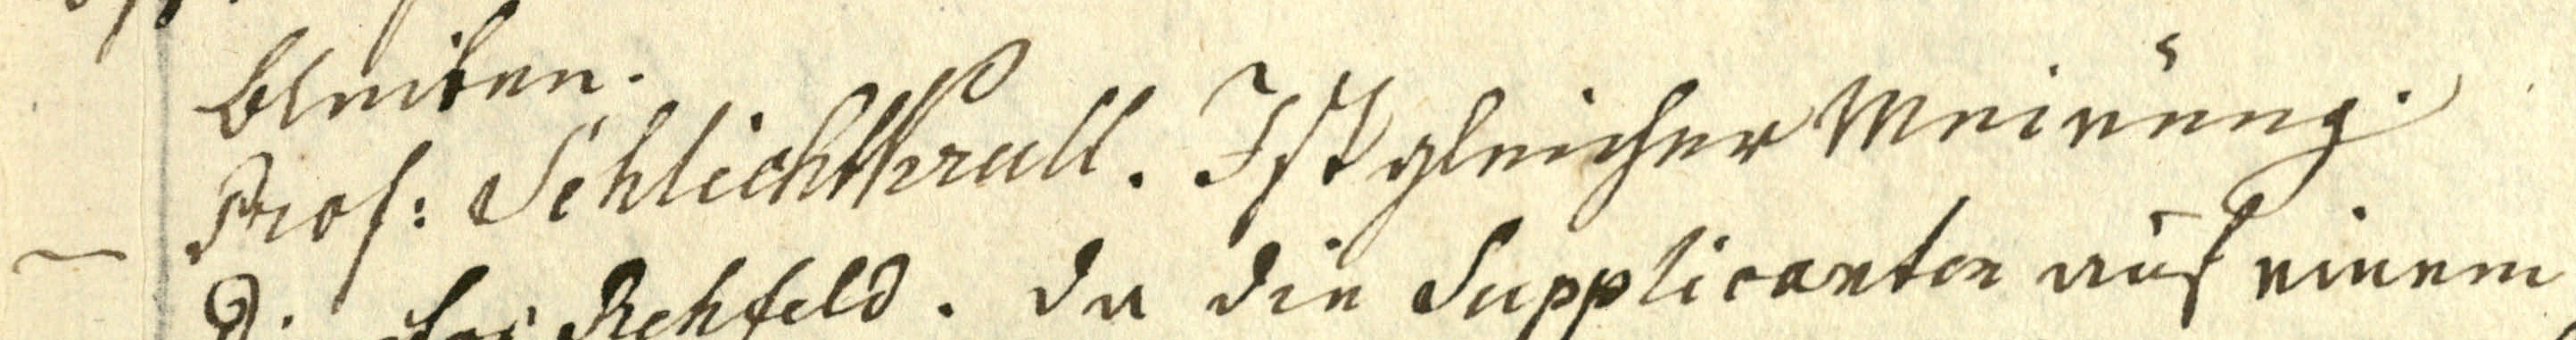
Prof. Schlichtkrull. Ist gleicher Meinung.
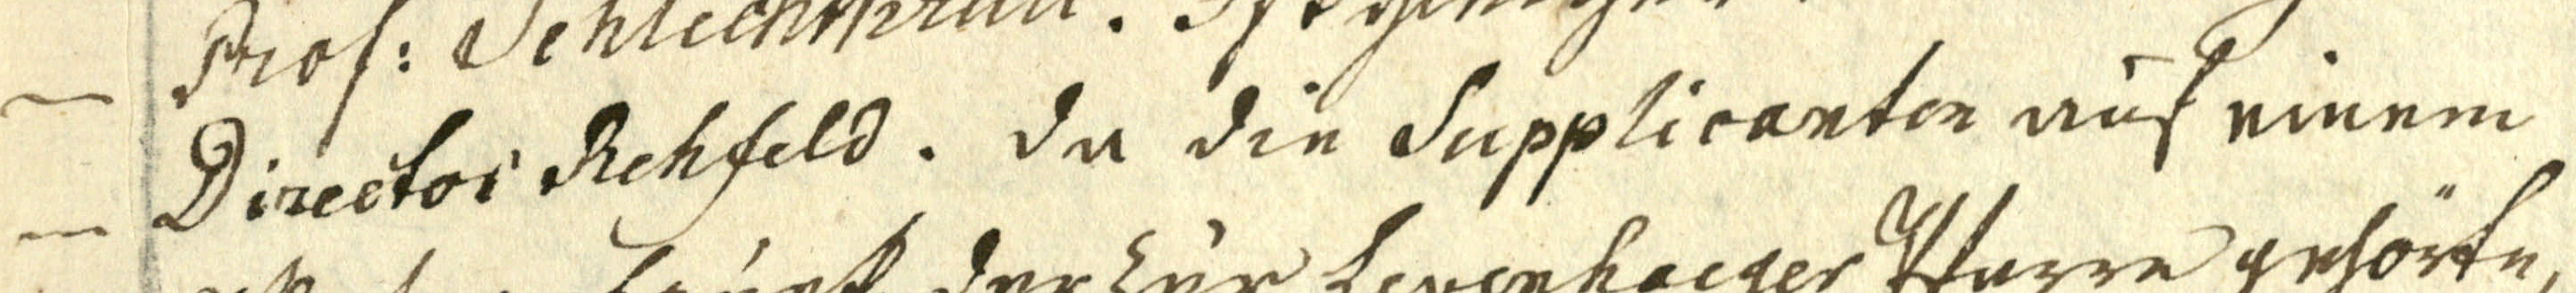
Director Rehfeld. Da die Supplicanten auf einem
